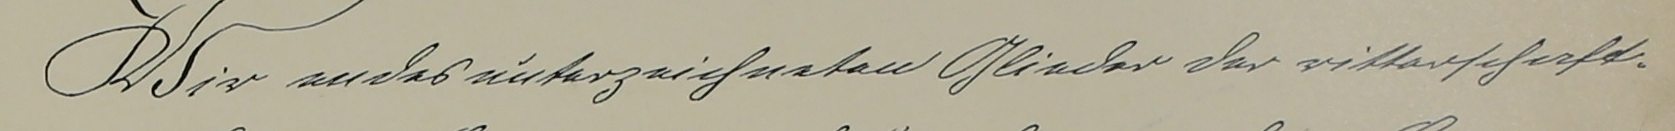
Wir endesunterzeichneten Glieder der ritterschaft-
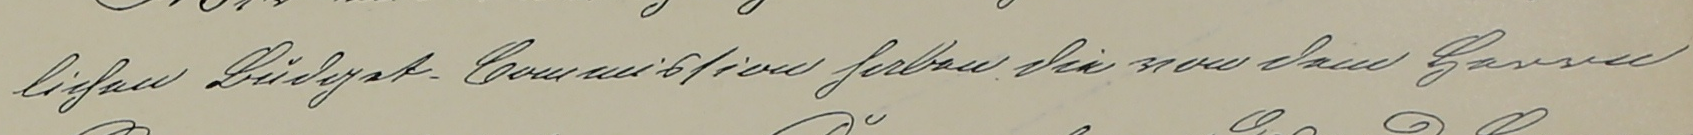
lichen Budget-Commission haben die von dem Herrn
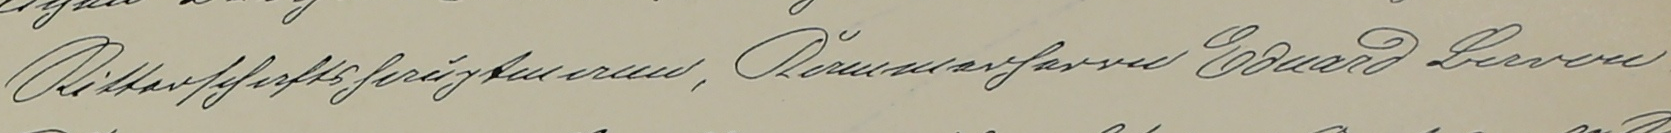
Ritterschaftshauptmann, Kammerherrn Eduard Baron
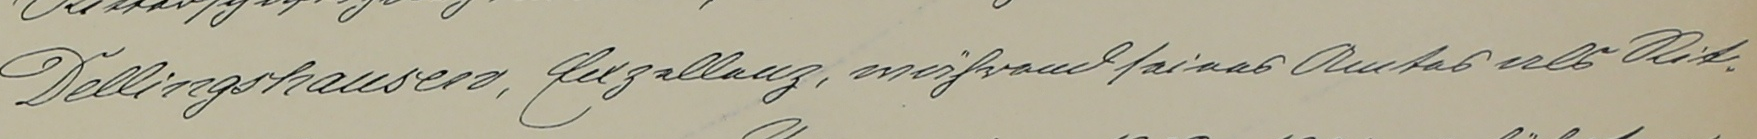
Dellingshausen, Exzellenz, während seines Amtes als Rit-
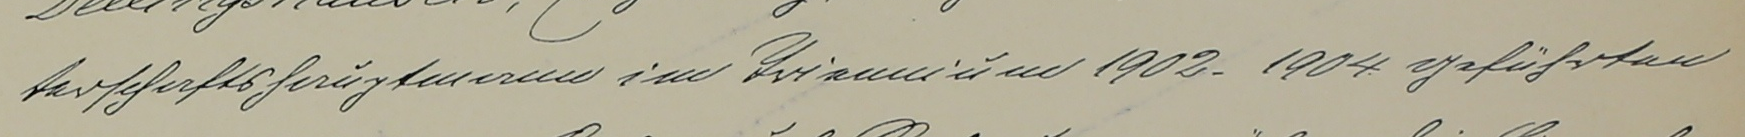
terschaftshauptmann im Triennium 1902-1904 geführten
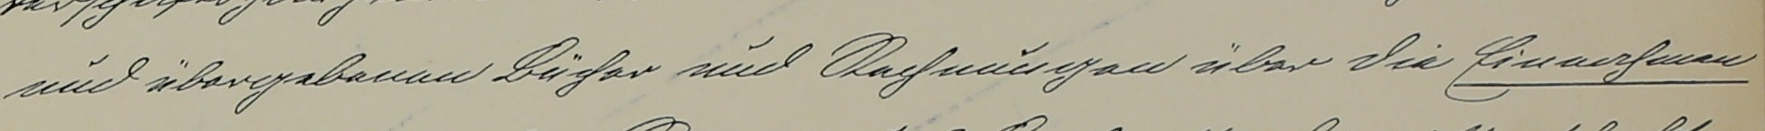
und übergebenen Bücher und Rechnungen über die Einnahmen
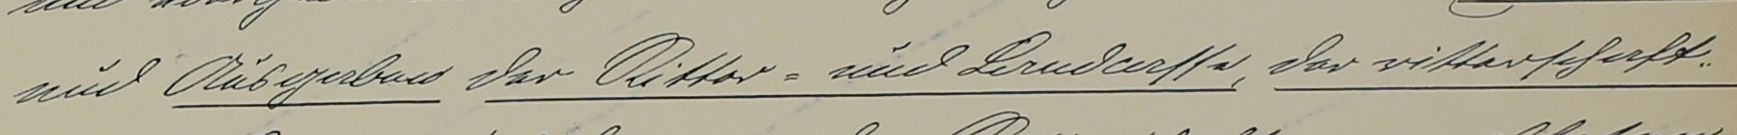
und Ausgaben der Ritter- und Landcasse, der ritterschaft-
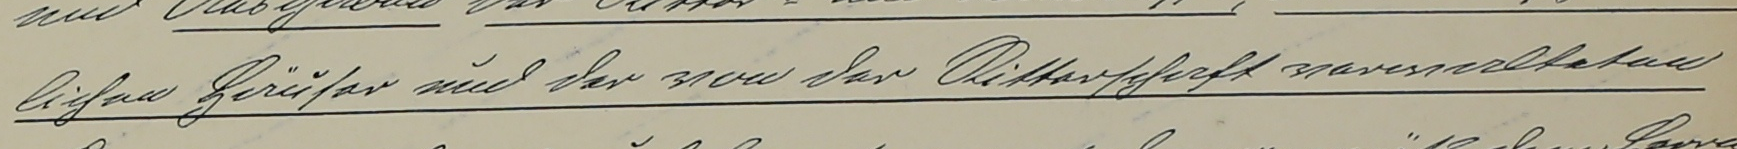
lichen Häuser und der von der Ritterschaft verwalteten
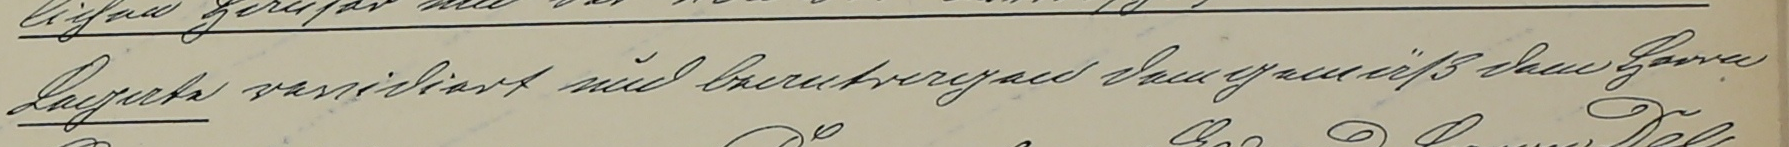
Legate revidiert und beantragen demgemäß dem Herrn
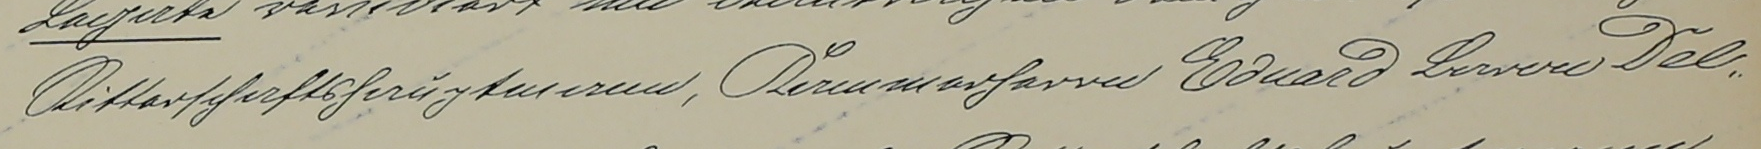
Ritterschaftshauptmann, Kammerherrn Eduard Baron Del-
